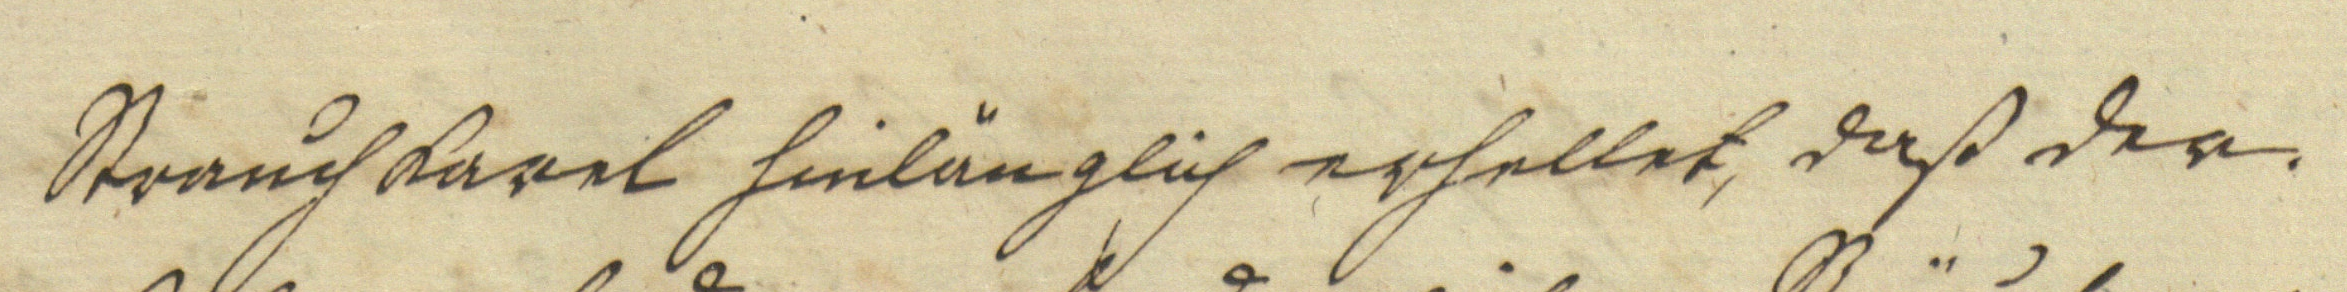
Strauchkavel hinlänglich erhellet, daß der-
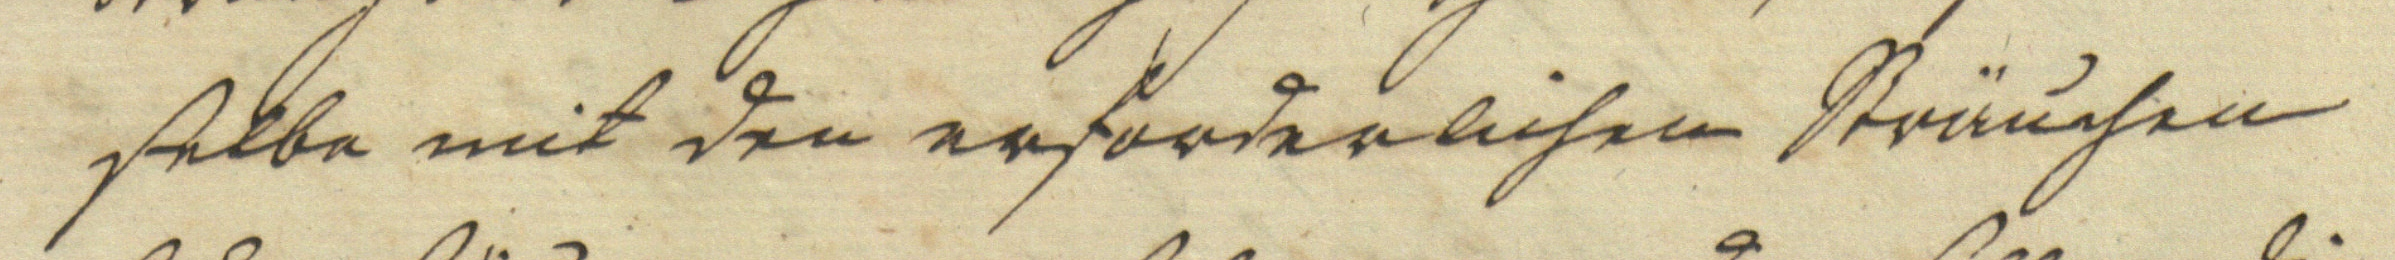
selbe mit den erforderlichen Sträuchen
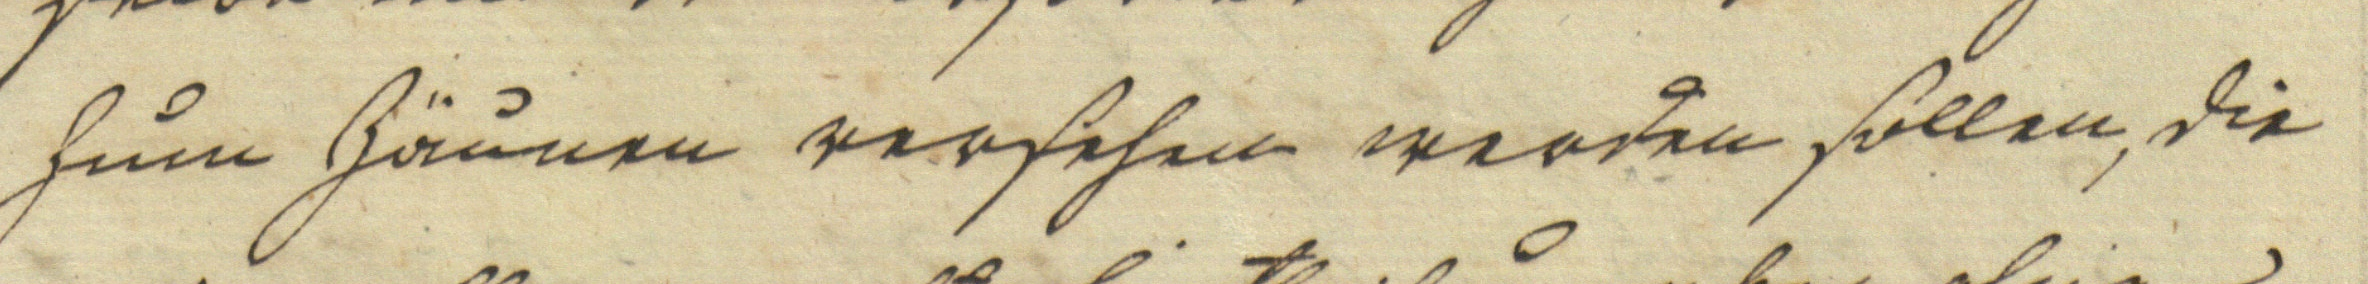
zum Zäunen versehen werden sollen, die
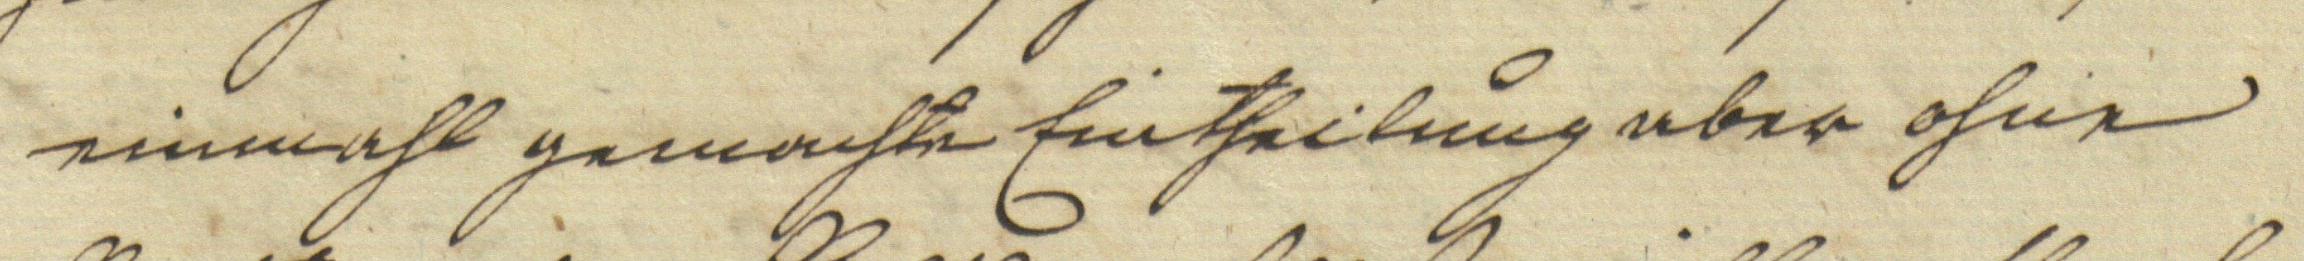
einmahl gemachte Eintheilung aber ohne
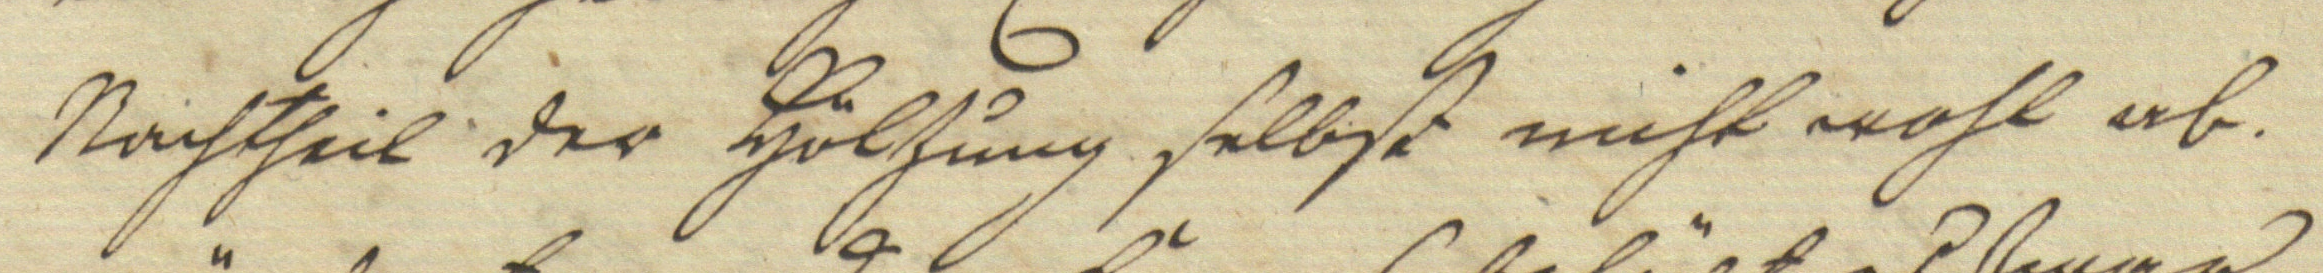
Nachtheil der Hölzung selbst nicht wohl ab¬
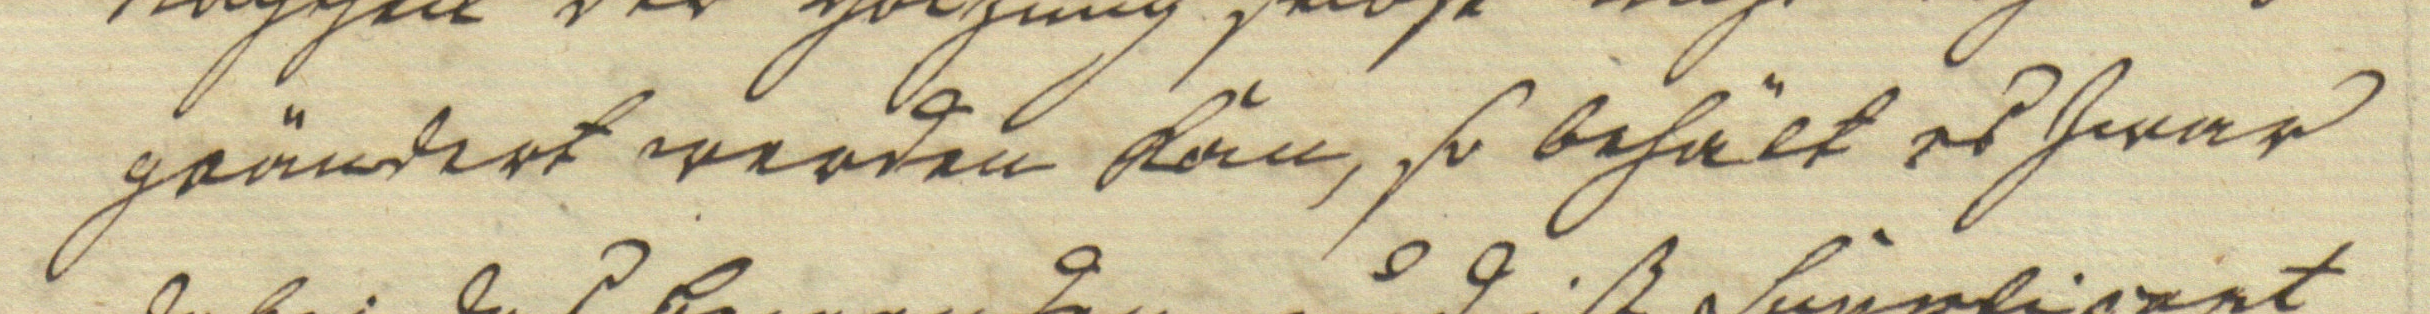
geändert werden kan, so behält es zwar
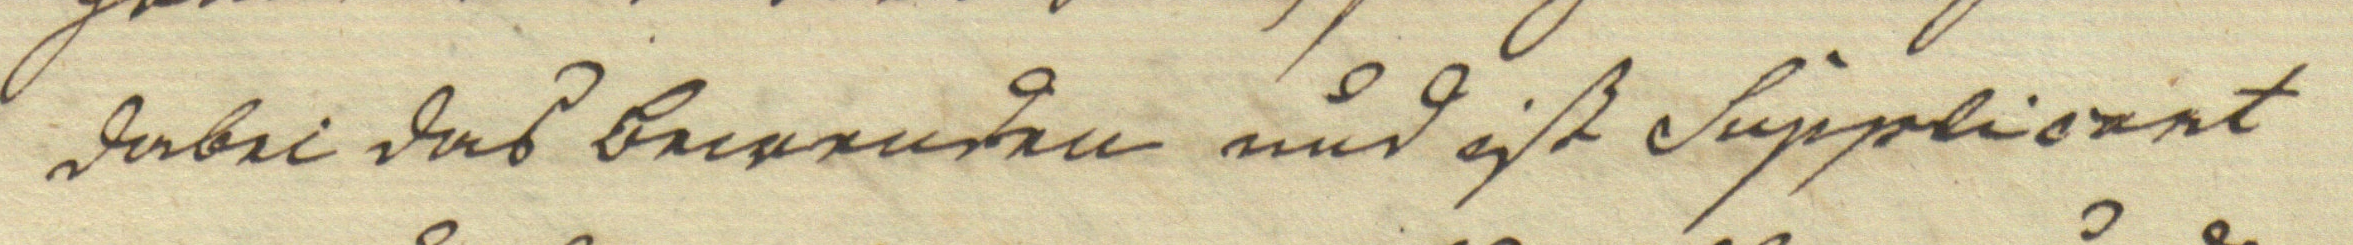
dabei das Bewenden und ist Supplicant
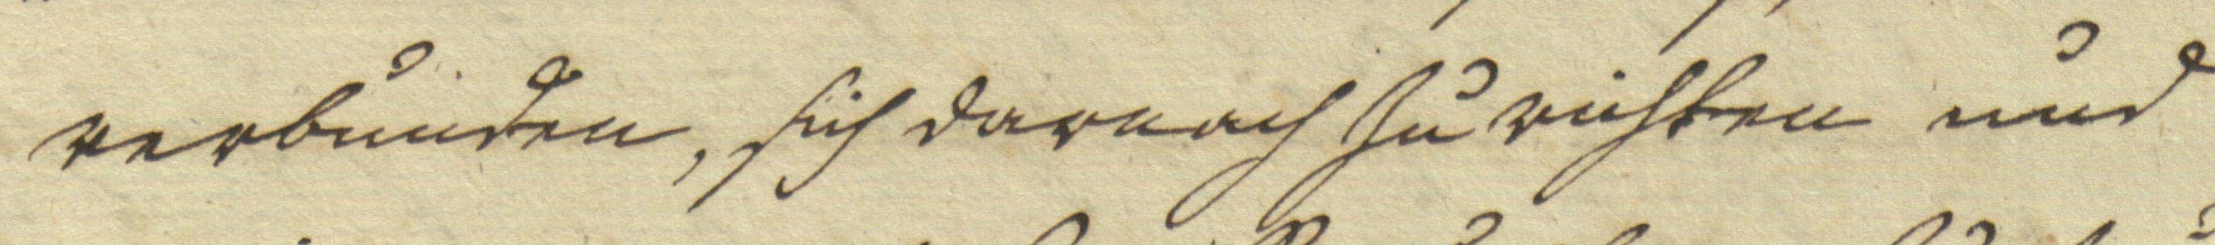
verbunden, sich darnach zu richten und
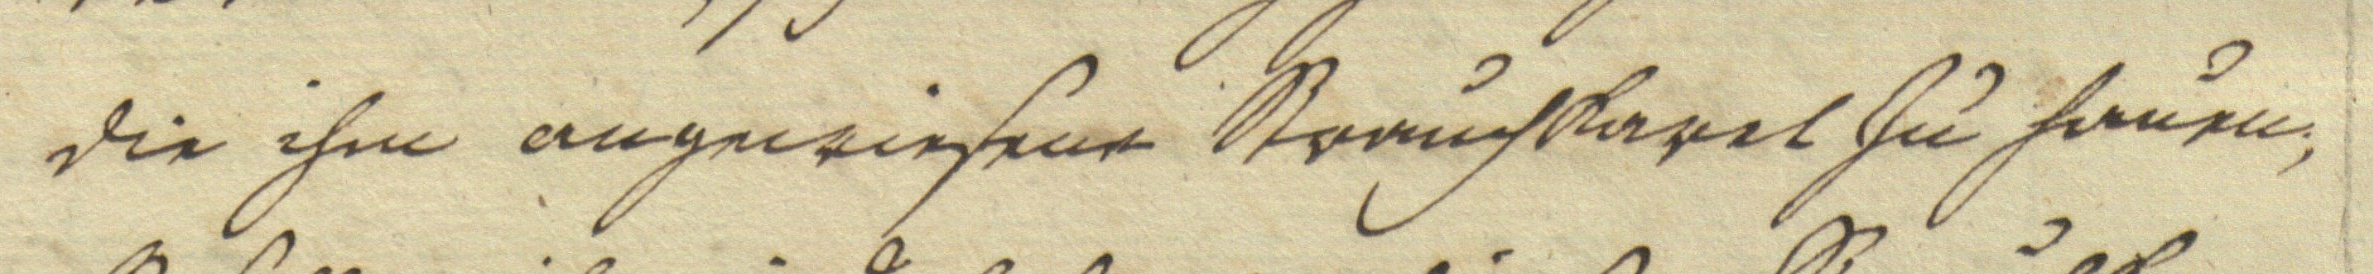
die ihm angewiesene Strauchkavel zu hauen,
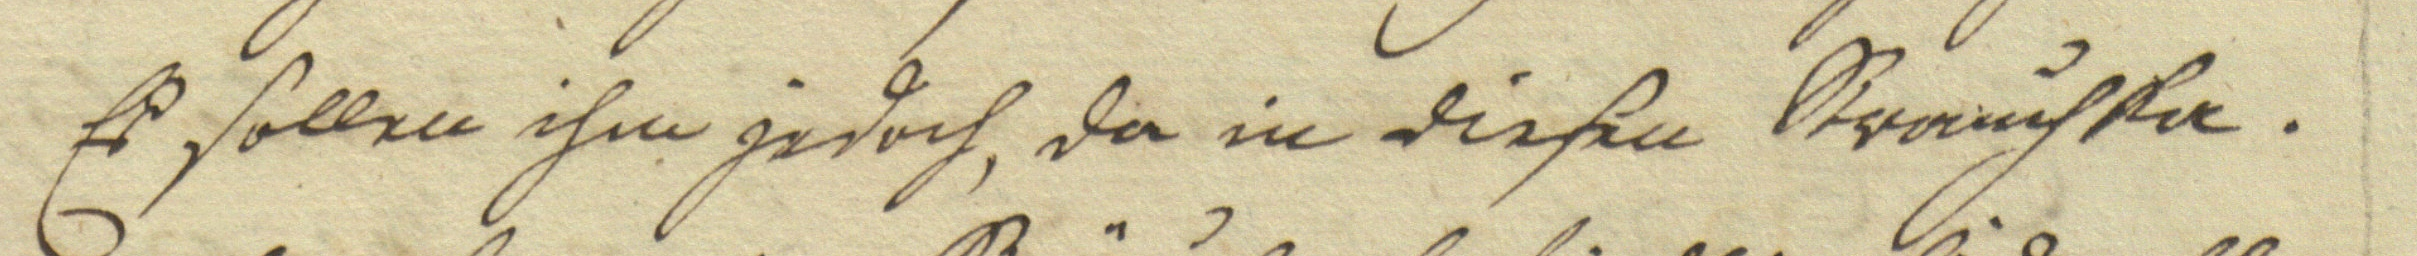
Es sollen ihm jedoch, da in diesen Strauchka¬
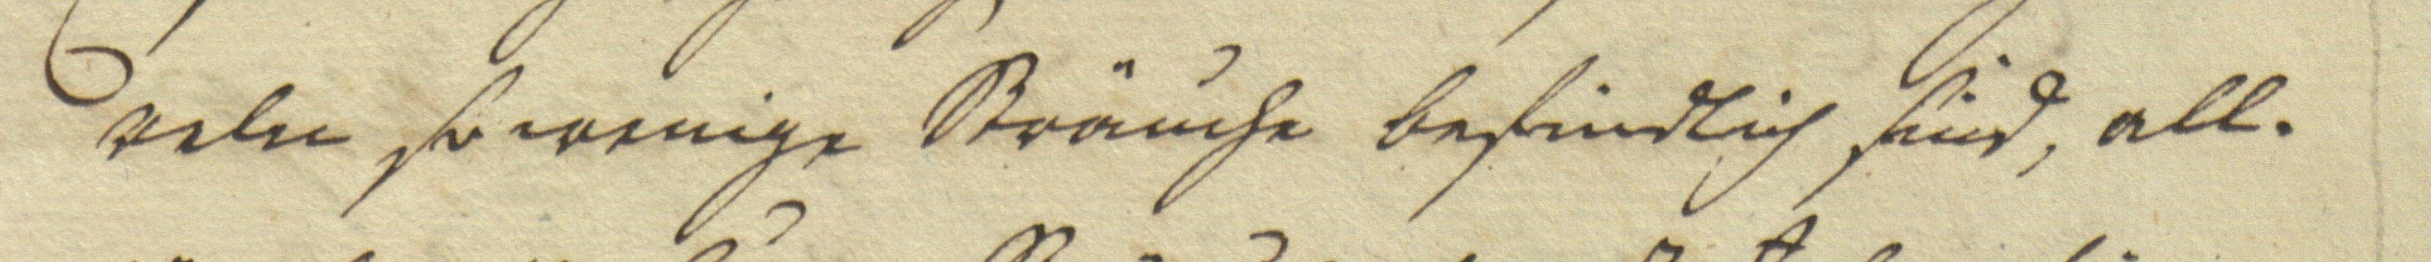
veln so wenige Sträuche befindlich sind, all¬
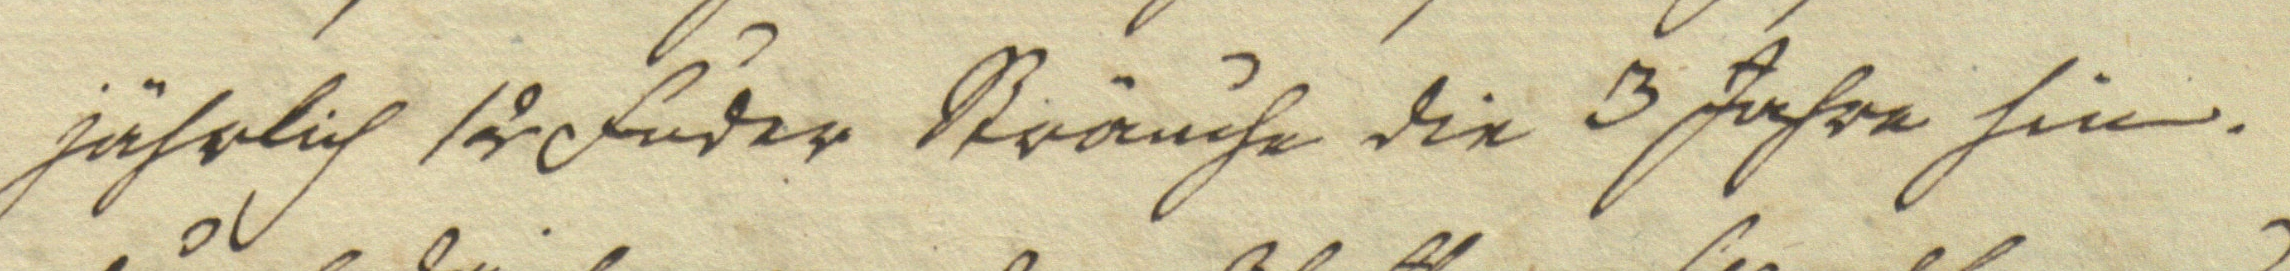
jährlich 12 Fuder Sträuche die 3 Jahre hin¬
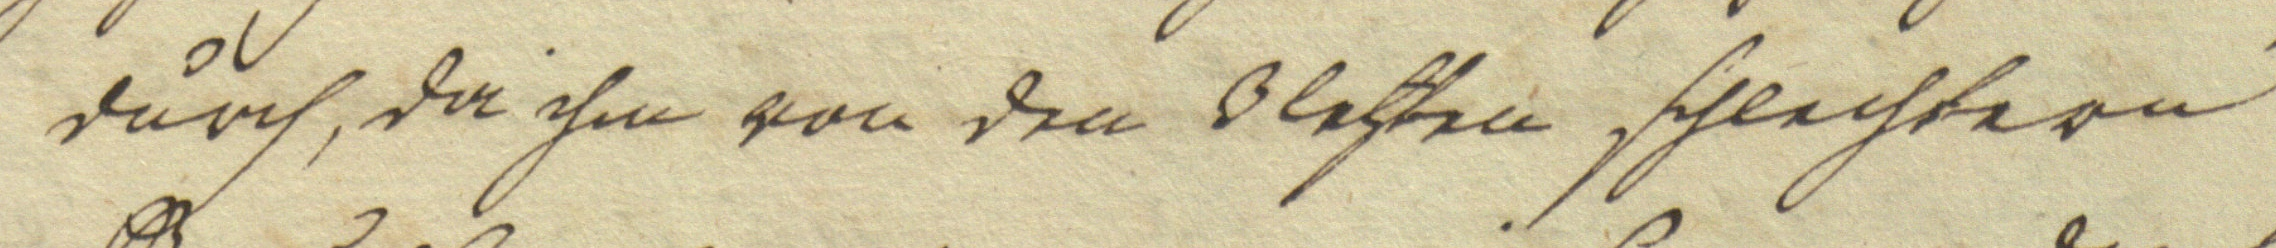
durch, da ihm von den 3 letzten schlechtern
